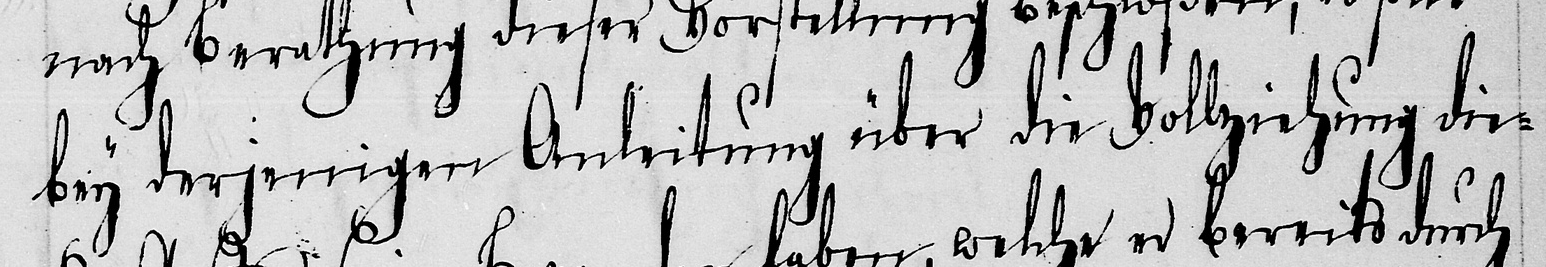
bey derjenigen Anleitung über die Vollziehung di¬
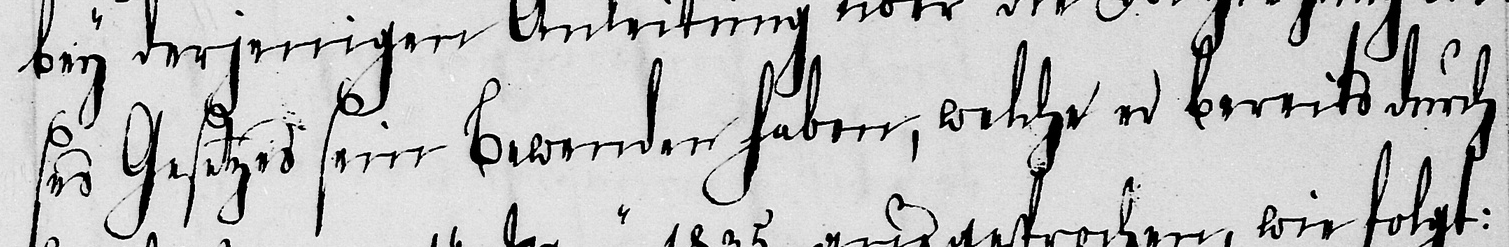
ses Gesetzes sein Bewenden haben, welche er bereits durch
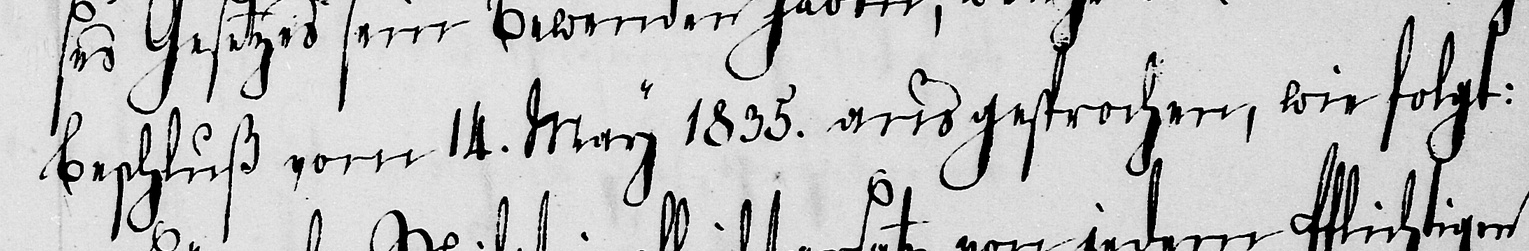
Beschluß vom 14. May 1835. ausgesprochen, wie folgt:
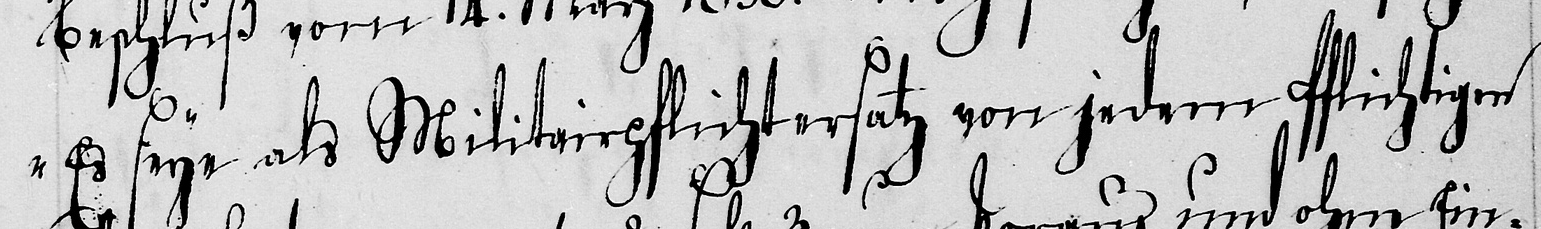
„Es sey als Militairpflichtersatz von jedem Pflichtigen
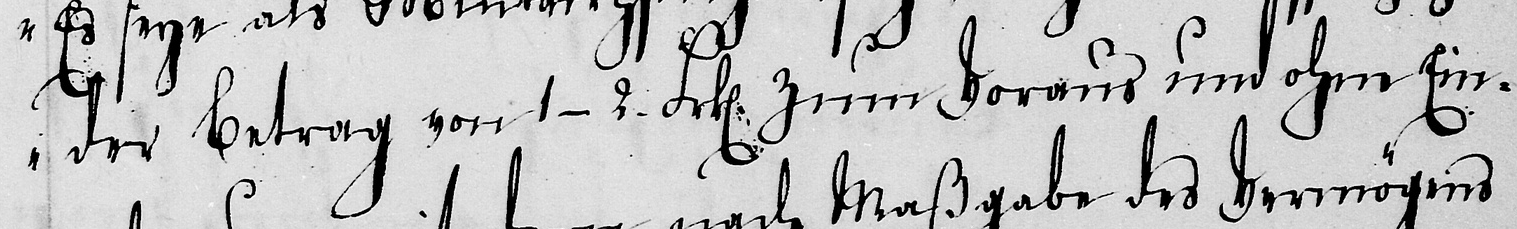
der Betrag von 1–2. Frk[en]. zum Voraus und ohne Ein¬
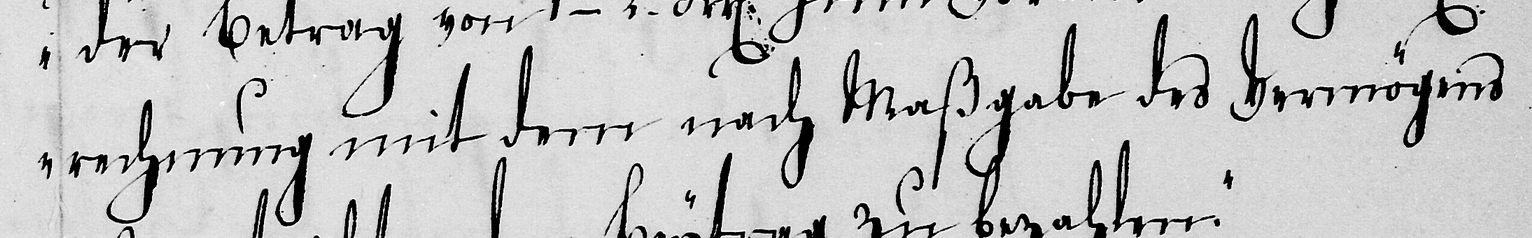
rechnung mit dem nach Maßgabe des Vermögens
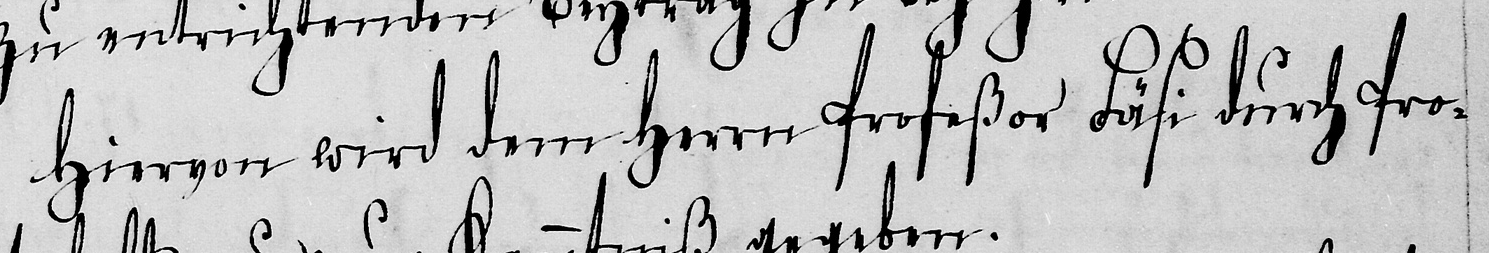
Hiervon wird dem Herrn Profeßor Fäsi durch Pr¬
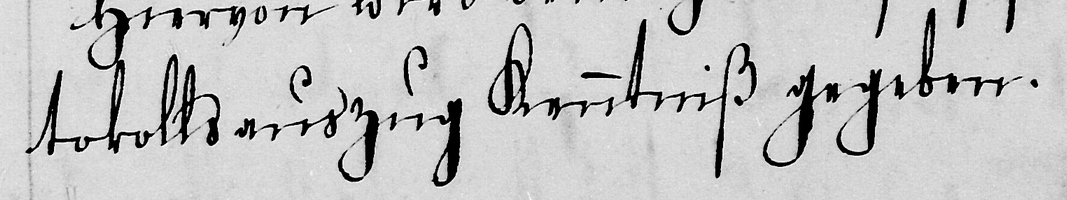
otokollsauszug Kenntniß gegeben.
